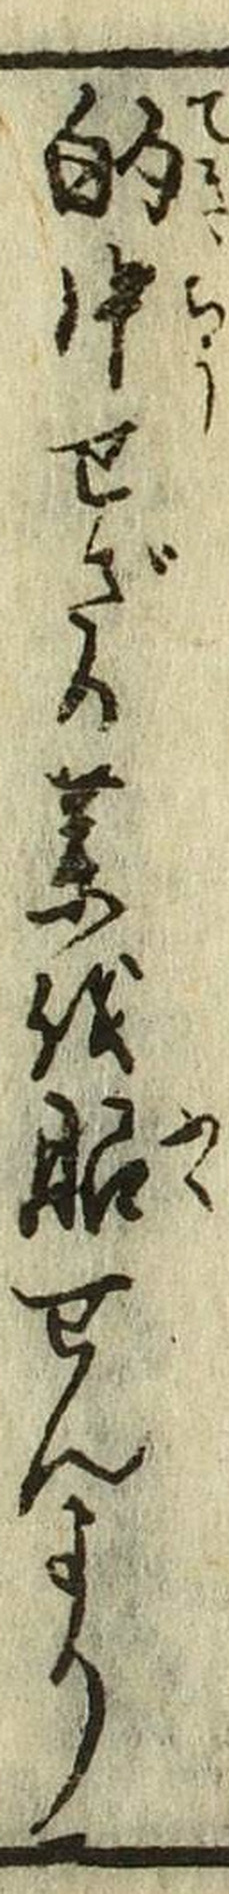的中せざる薬を服せんより
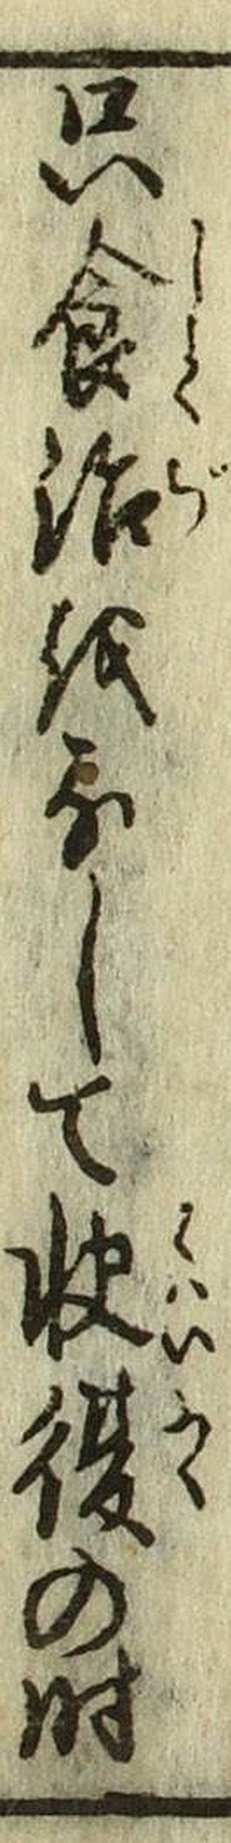只食治をなして快復の時
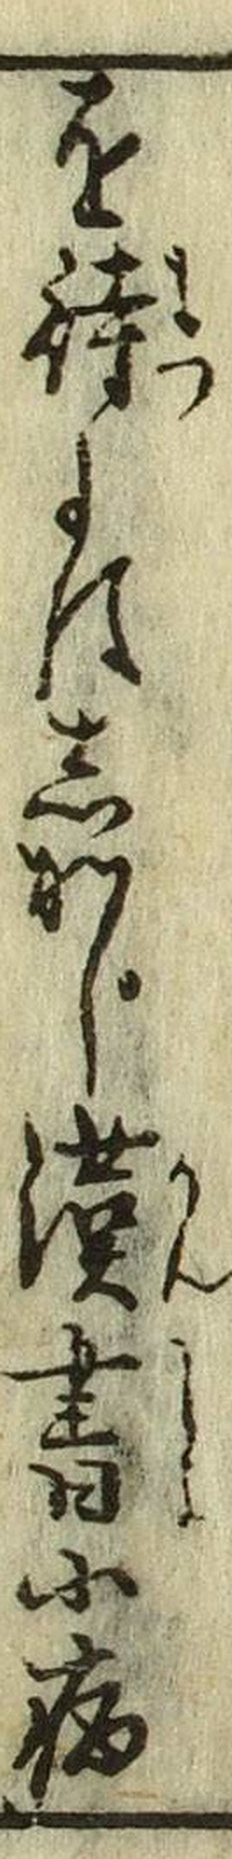を待にはしかじ漢書に病
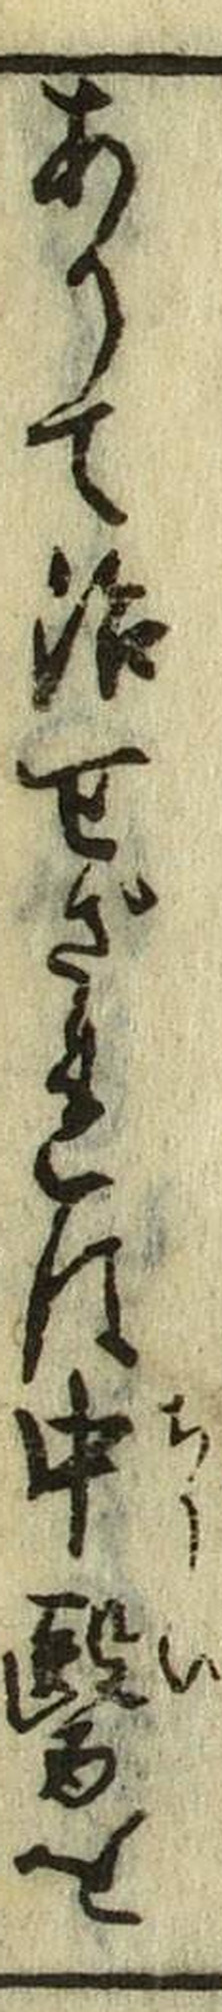ありて治せざれは中医を

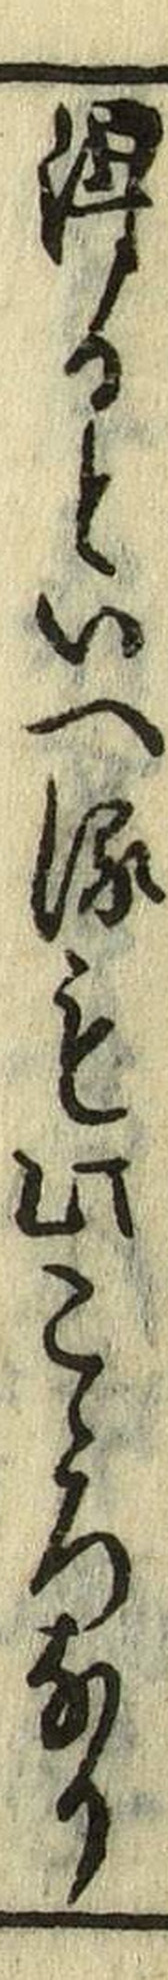得るといへるも此こゝろなり
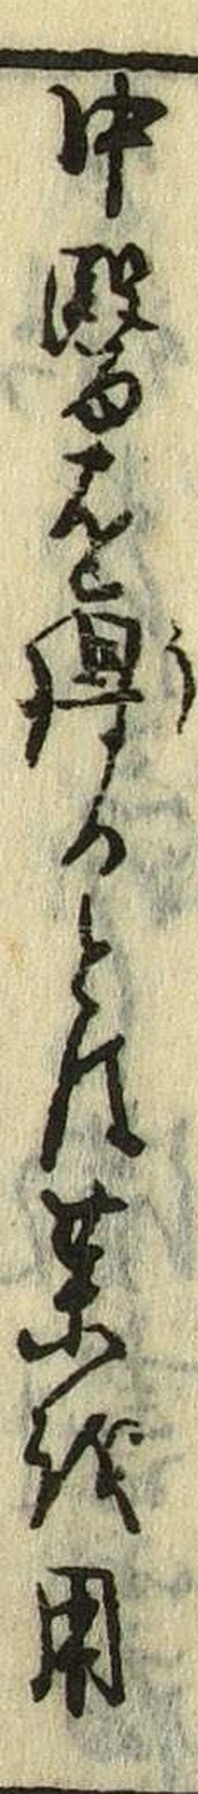中医を得るとは薬を用
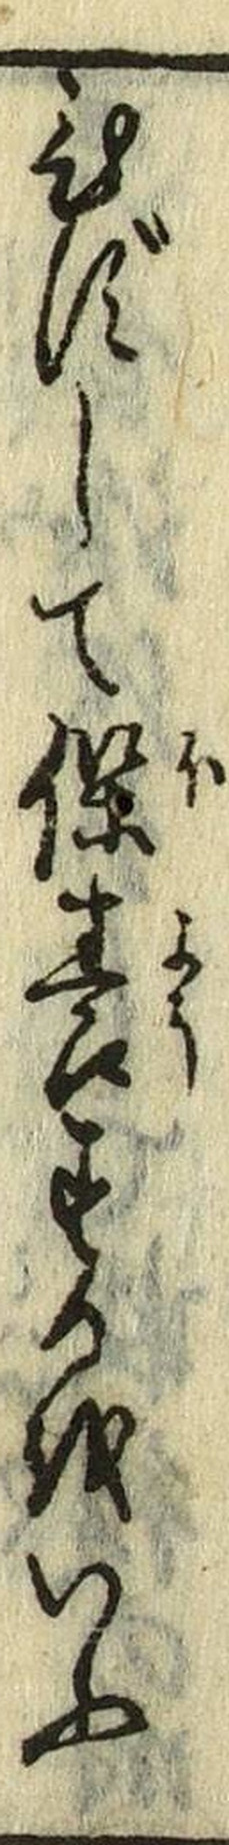ひずして保養するをいふ
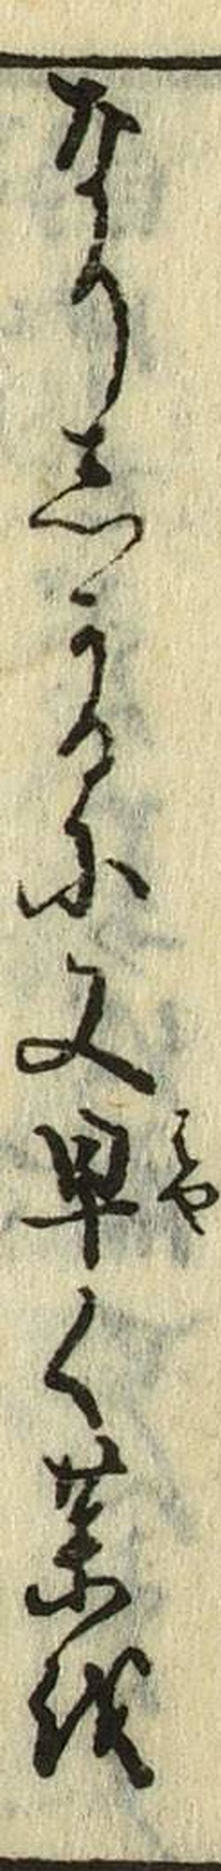なりしかるに又早く薬を
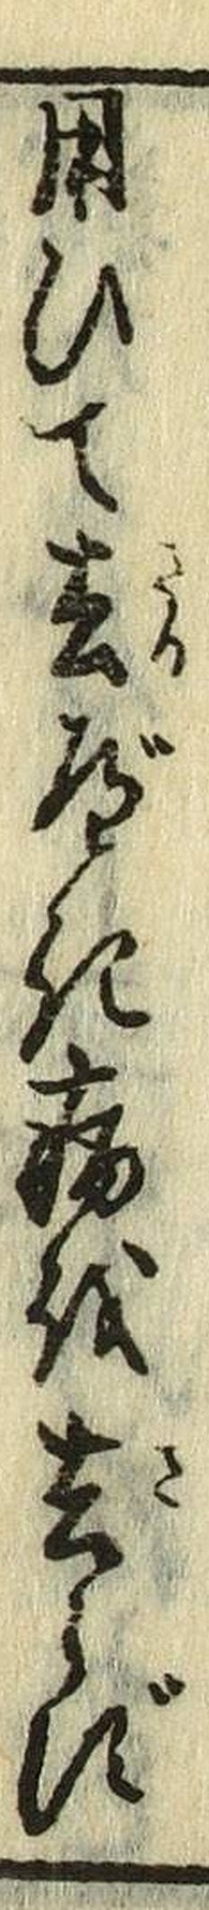用ひて去べき病を去らず
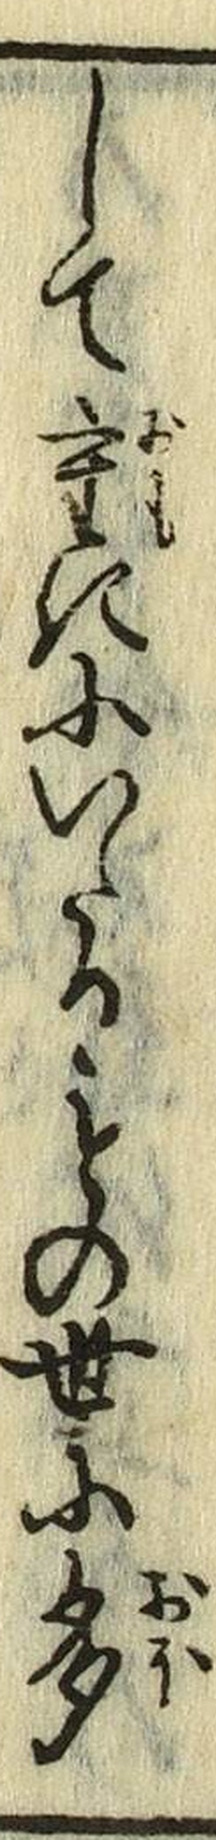して重きにいたるもの世に多
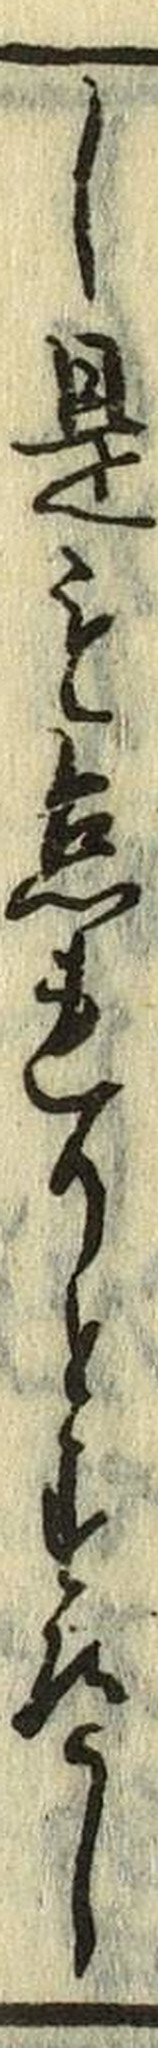し是も怠れりとすへし
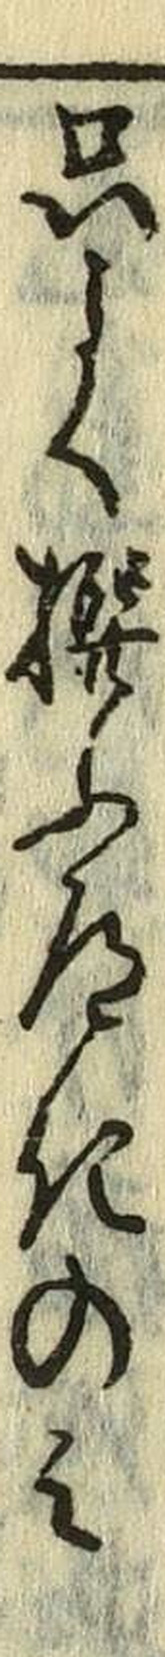只よく撰ふへきのみ
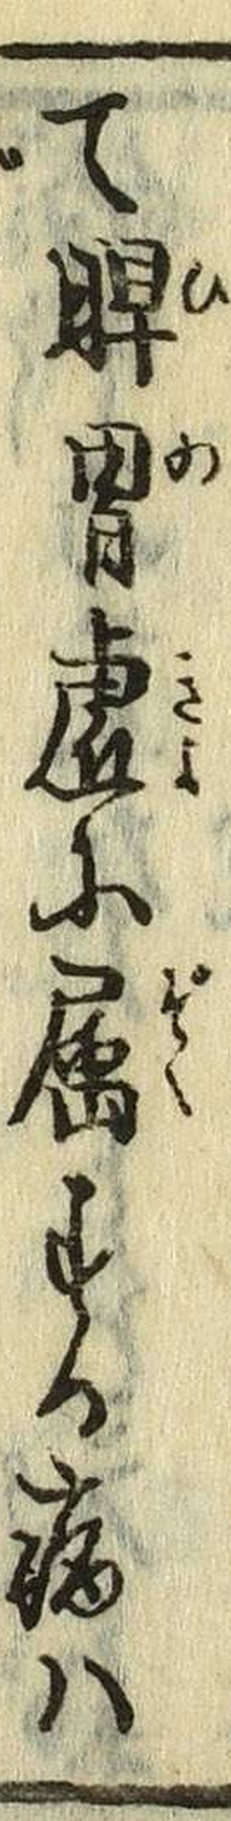て脾胃虚に属する病は
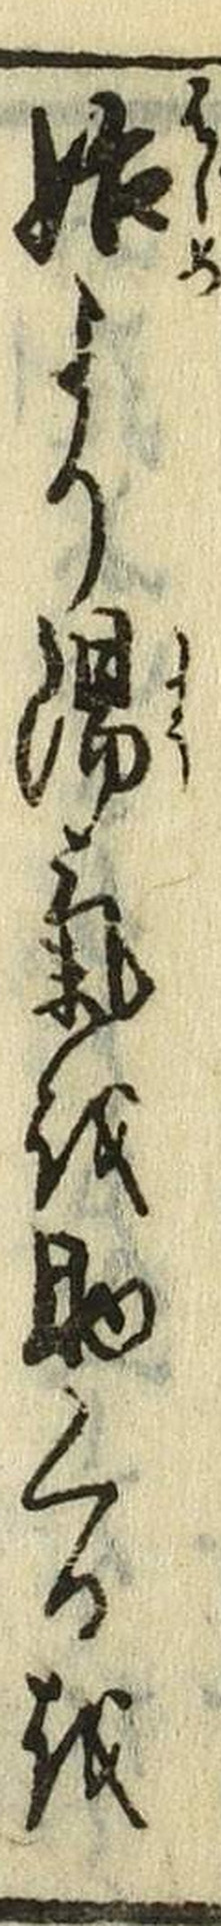始より陽気を助くるを
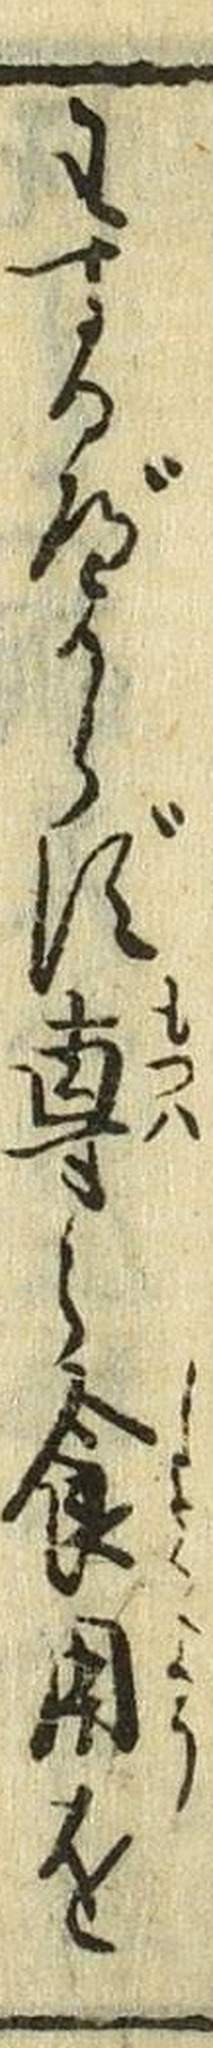わするべからず専ら食用を
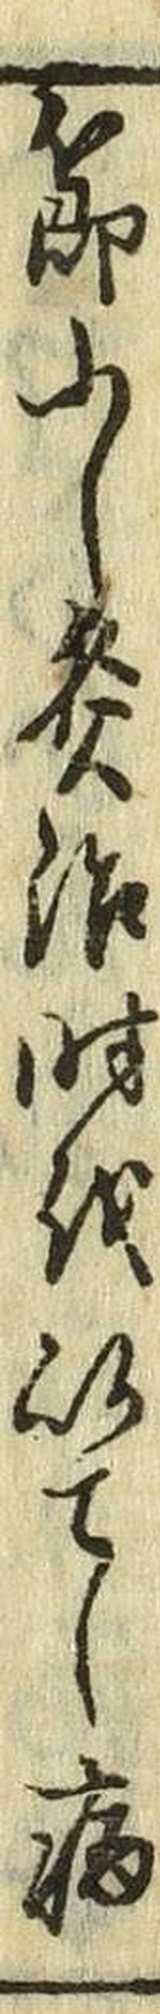節にし灸治時を以てし病
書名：居家養生記
